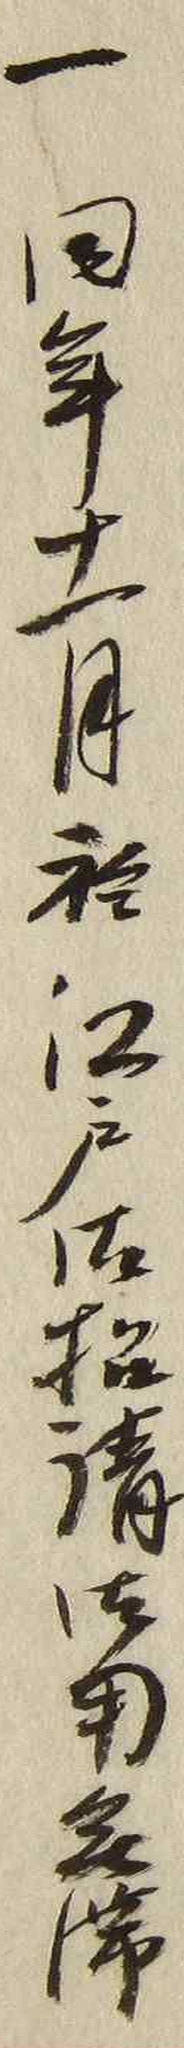一同年十一月於江戸御招請御用無滞

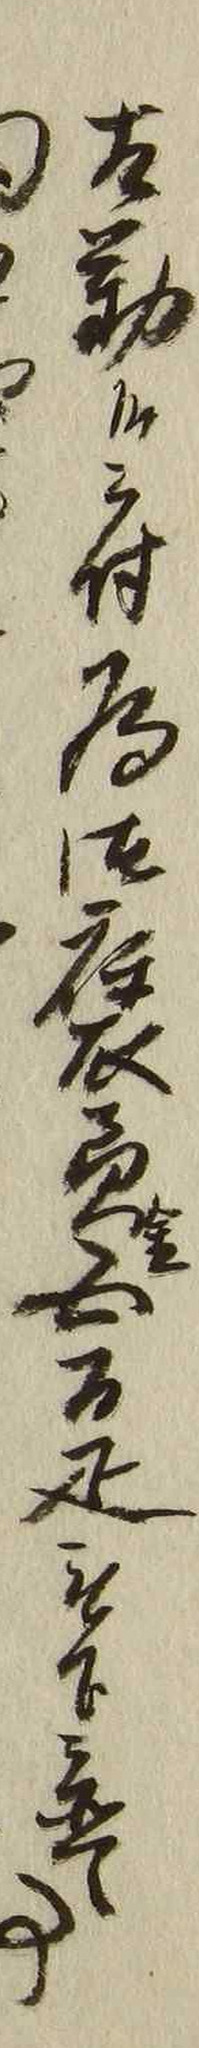相勤候ニ付為御褒美金五百疋被下置候事
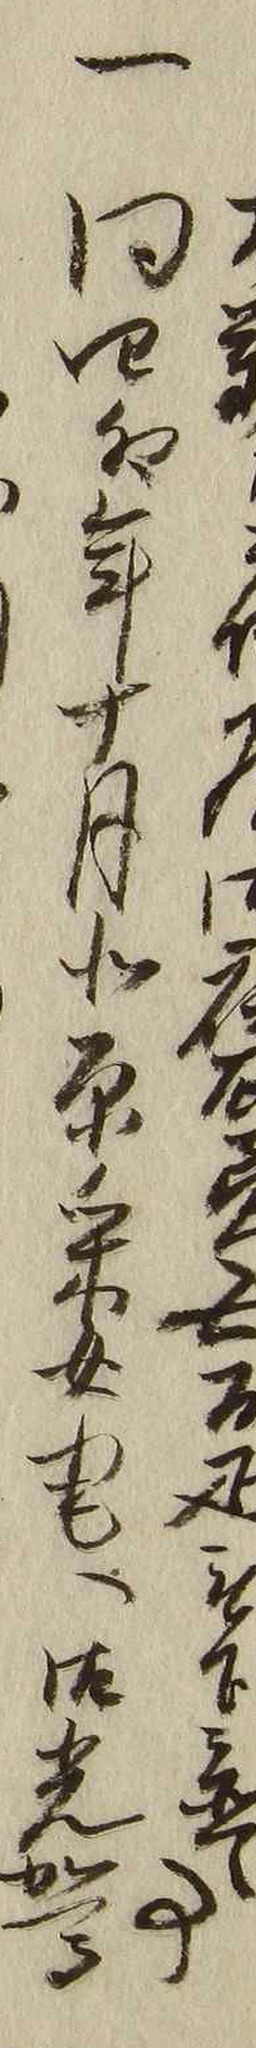一同四卯年十月北原采女宅へ御光駕
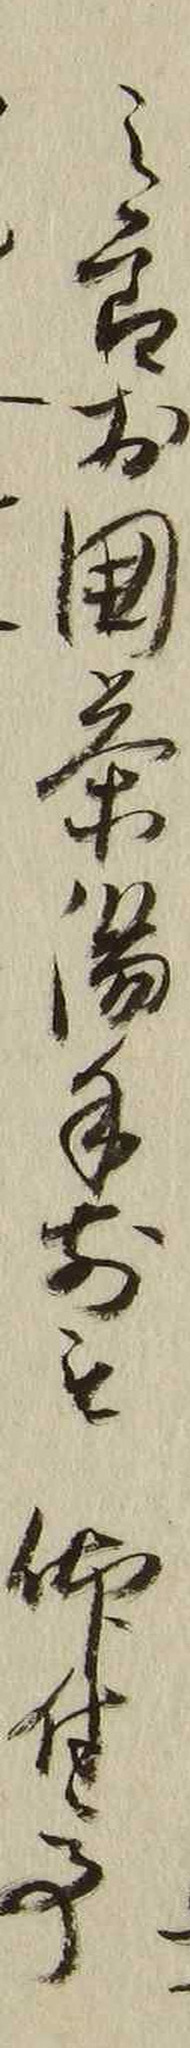之節於囲茶湯手前被仰付候事
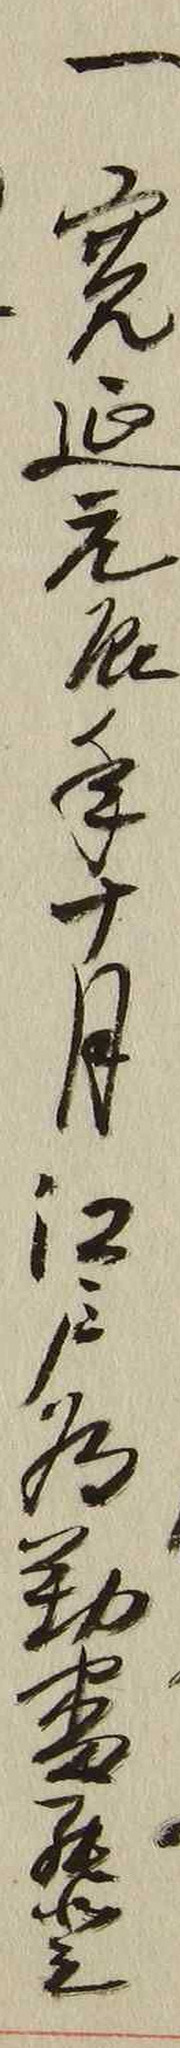一寛延元辰年十月江戸為勤番罷登
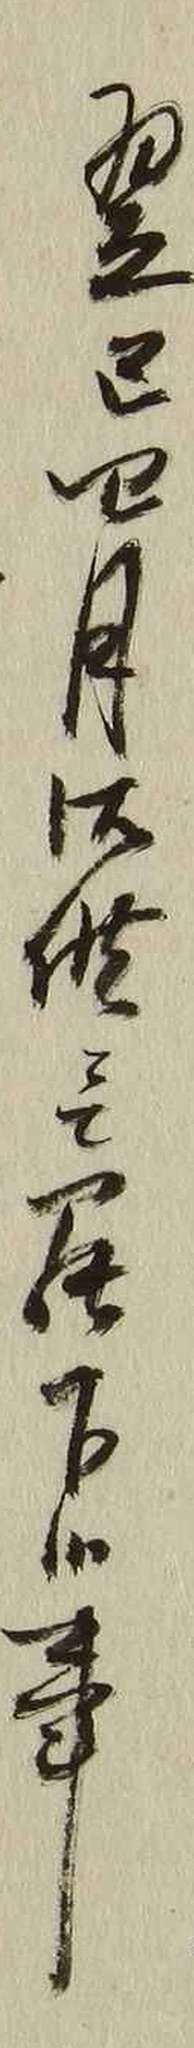翌巳四月御供ニて罷下候事
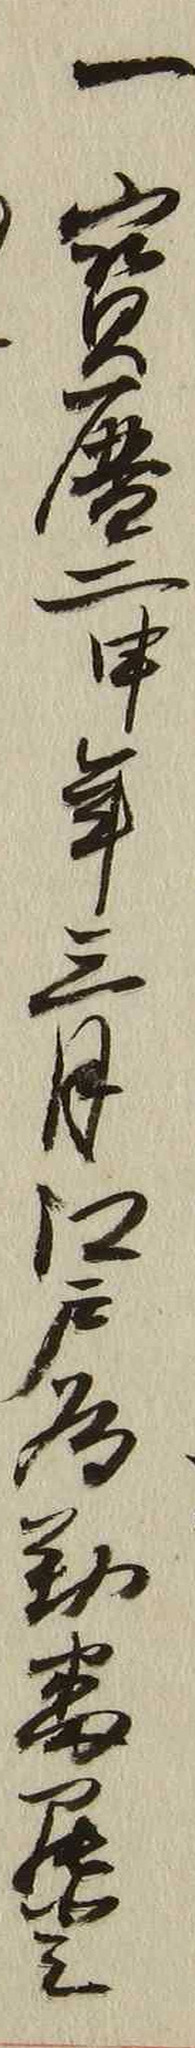一宝暦二申年三月江戸為勤番罷登
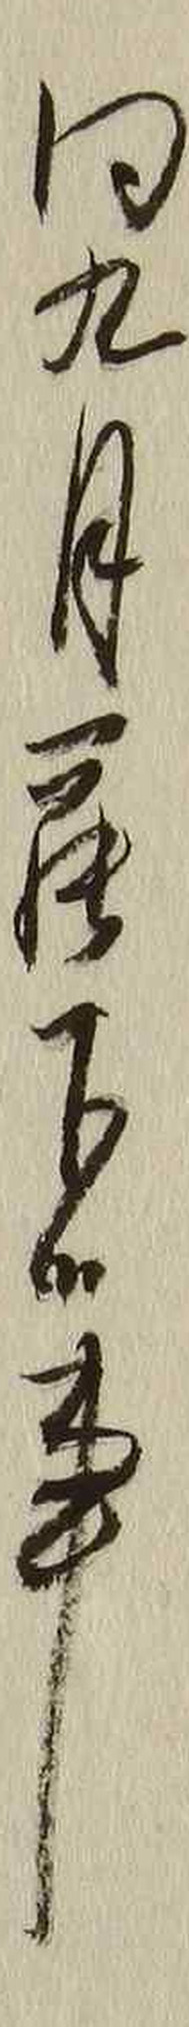同九月罷下候事
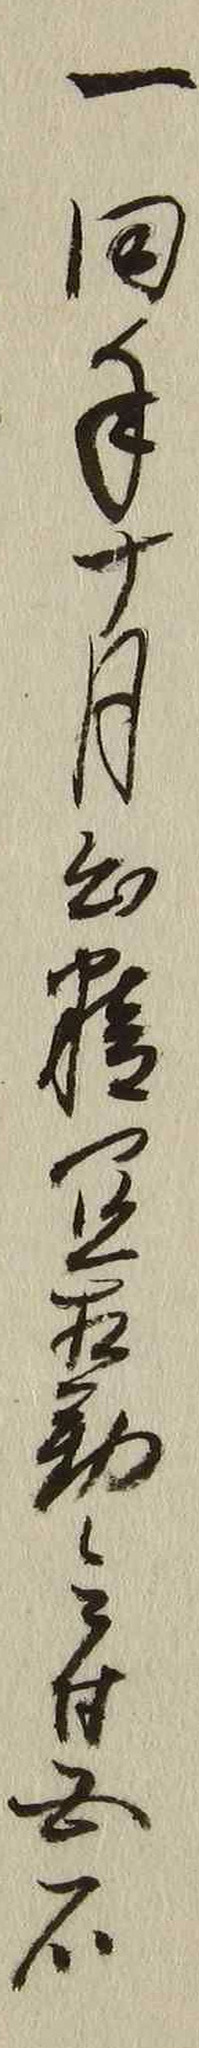一同年十月出精宜相勤候ニ付五石
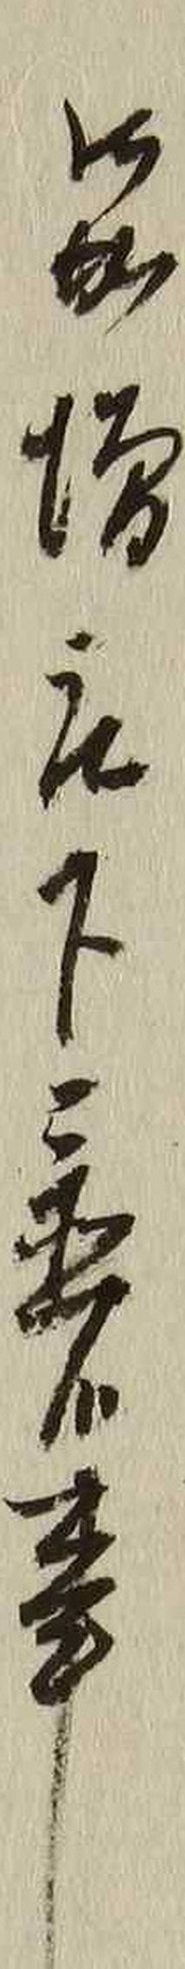御加増被下置候事
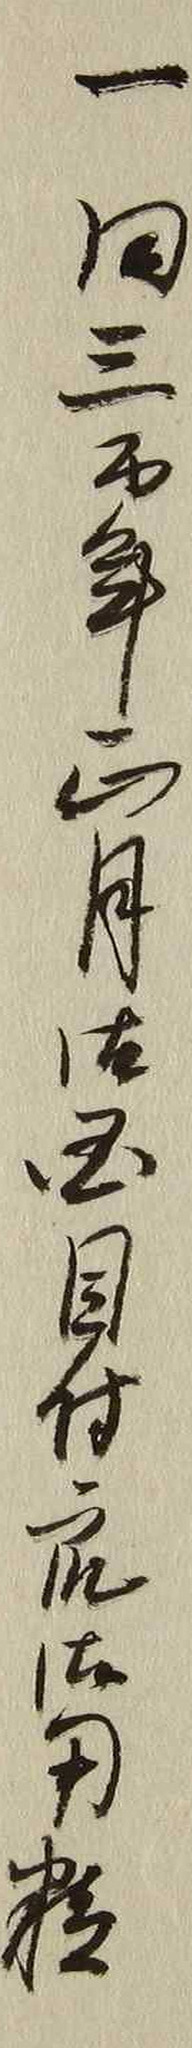一同三酉年正月御国目付衆御用精
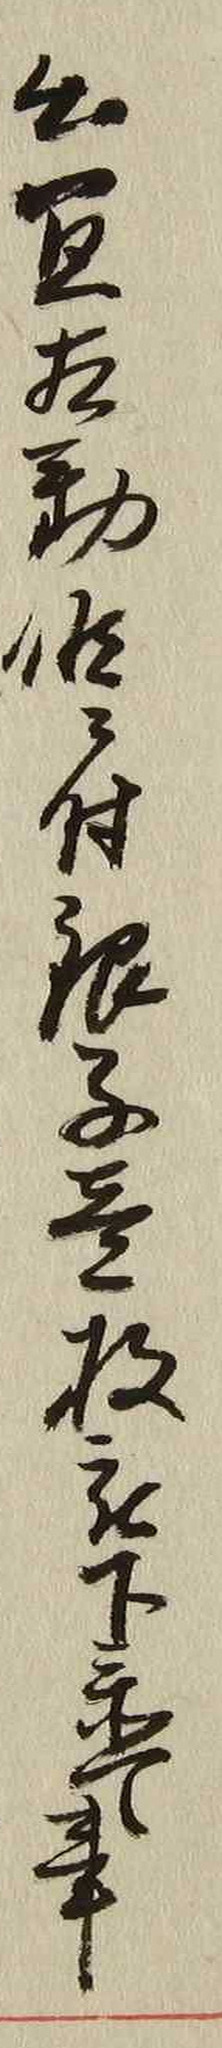出宜相勤候ニ付銀子壱枚被下置候事
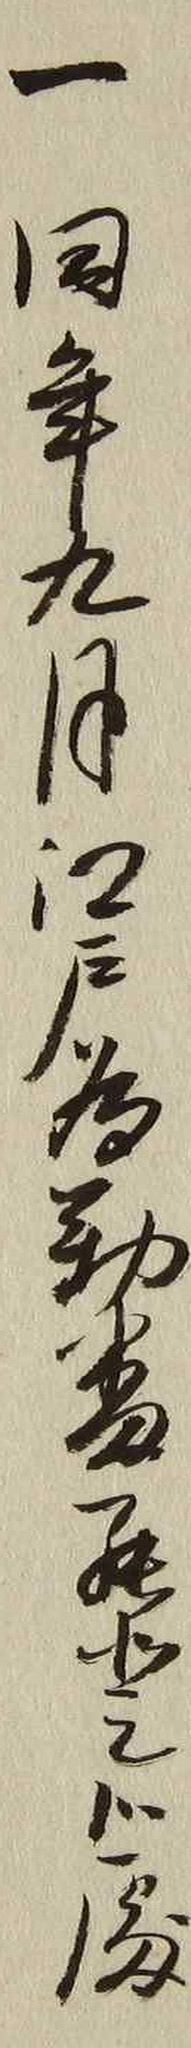一同年九月江戸為勤番罷登候処
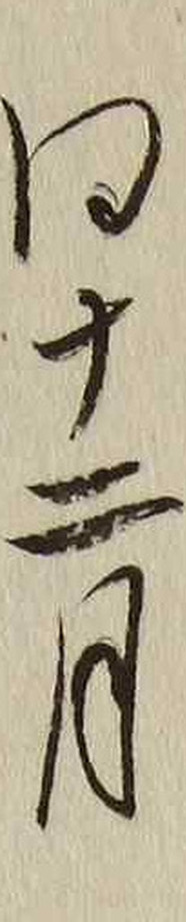同十二月
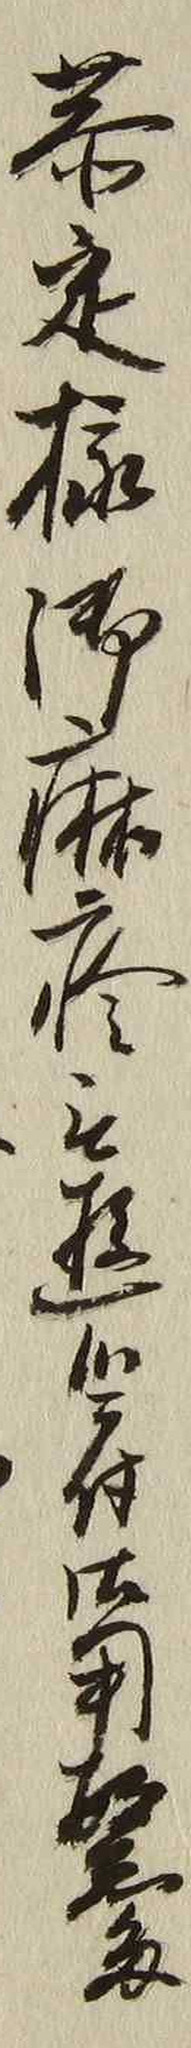恭定様御痳疹被遊候ニ付御用繁多
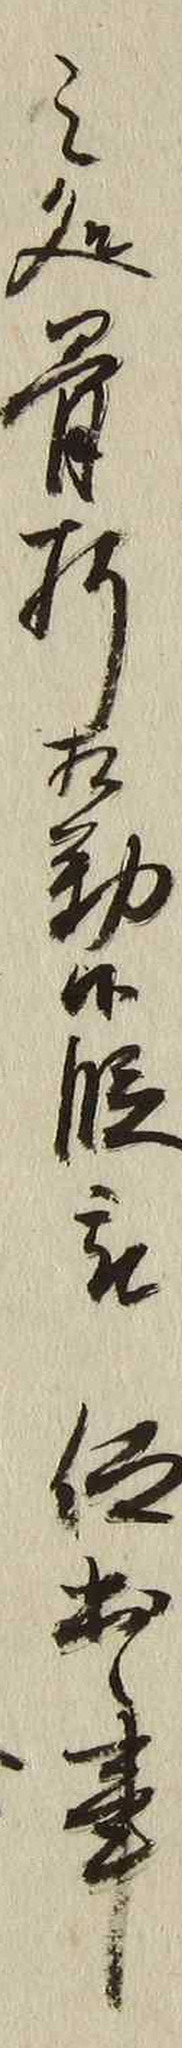之処骨折相勤候段被仰出候事
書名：諸士系譜　巻之349　も之部5
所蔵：会津若松市立会津図書館
